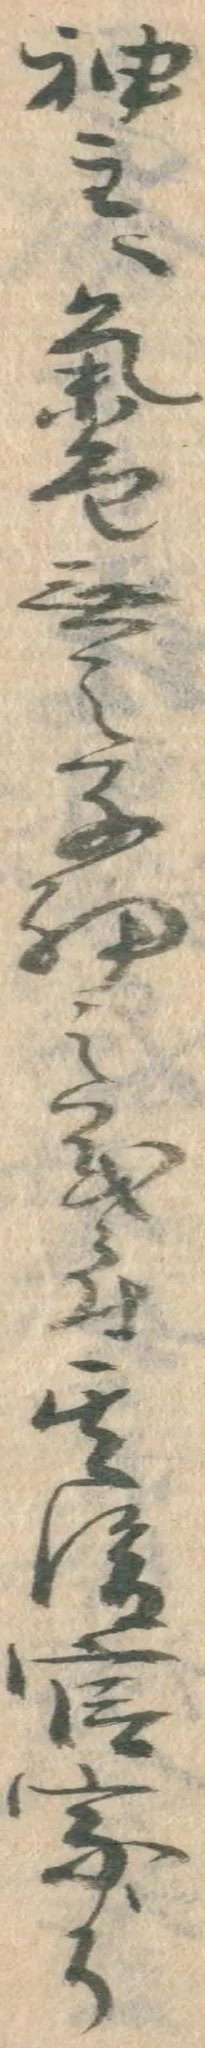神主へ気色無之子細之義二付、其後官家より
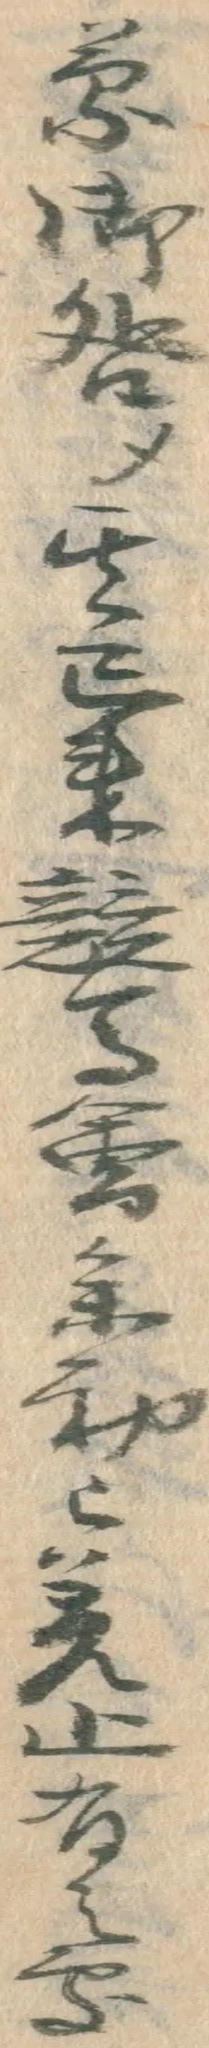蒙御咎メ其已、来競馬會参勤被差止有之処、
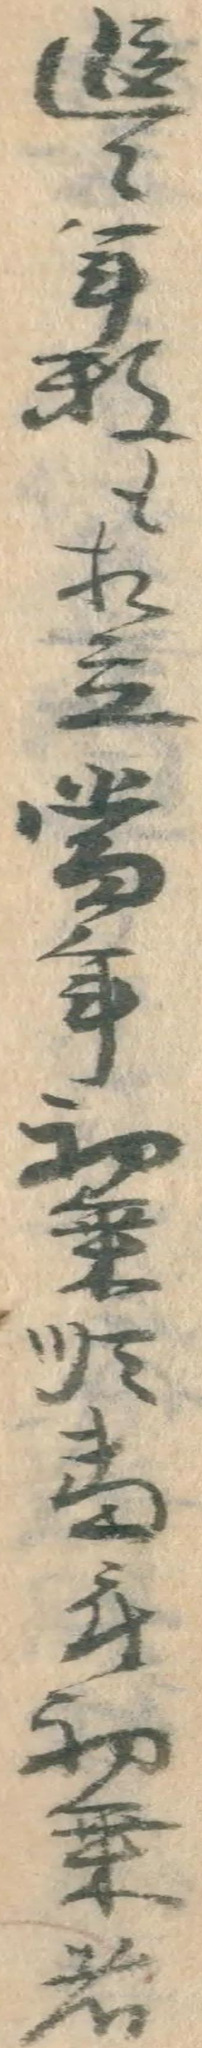追々年数も相立、當年初乗順番ニ付、初乗者

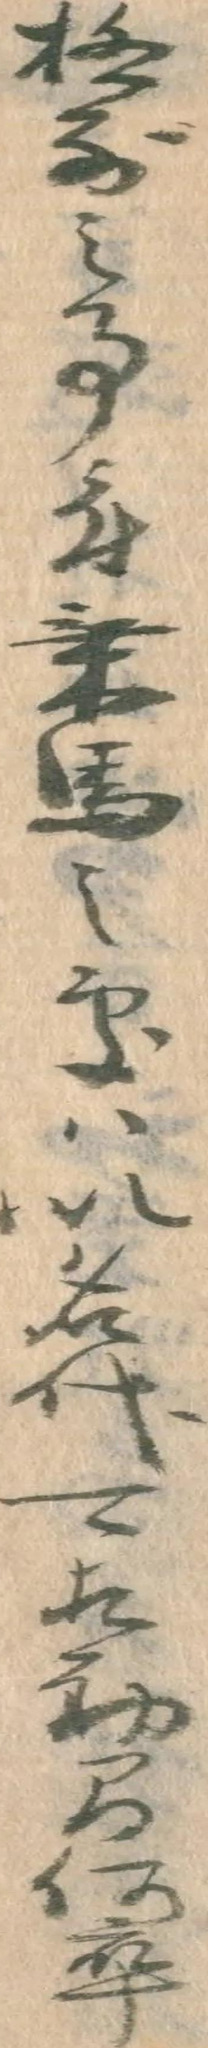格別之事ニ付、乗馬之処ハ以名代可相勤間、何卒
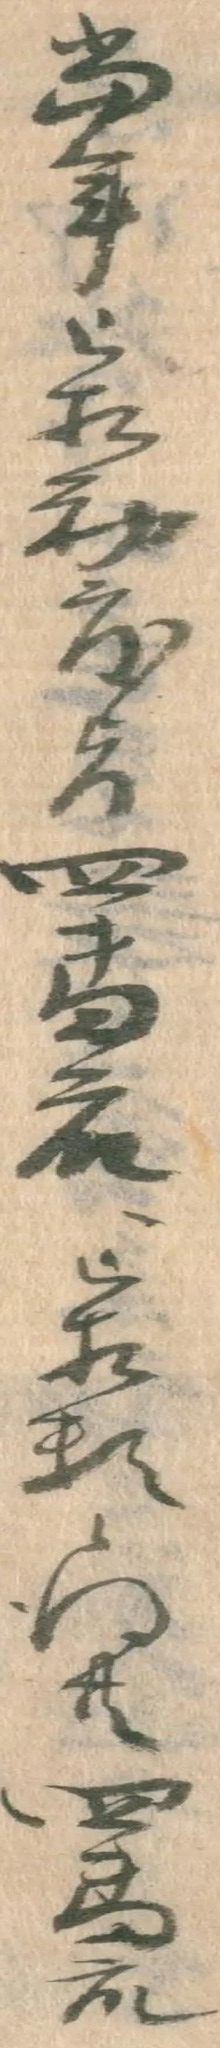當年被相勤度旨、四番衆へ被相頼候得共、四番衆
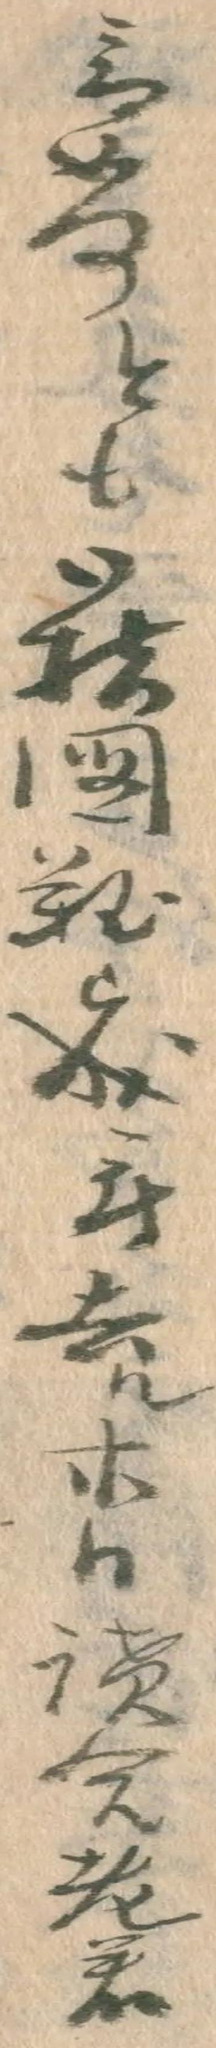二而如何とも御指図難被成二付、去ル廿日談合、老若
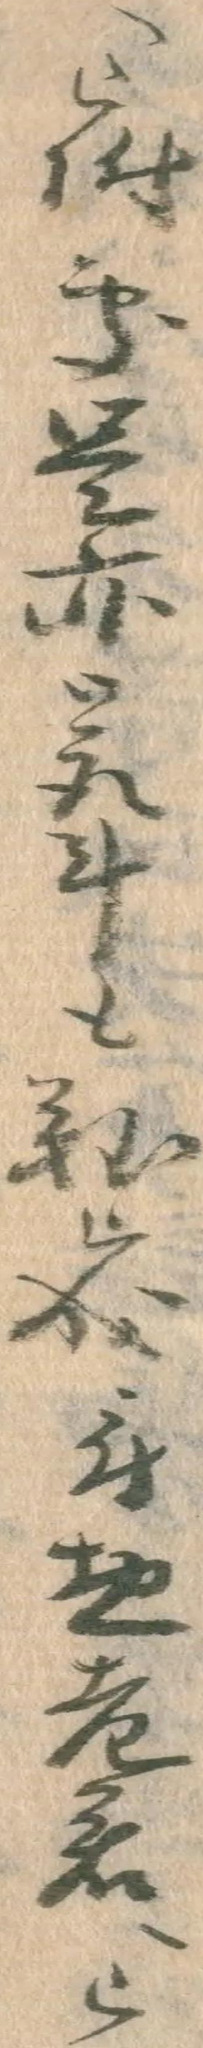へ被附處、是亦御取計も難被成ニ付、惣老若へ被
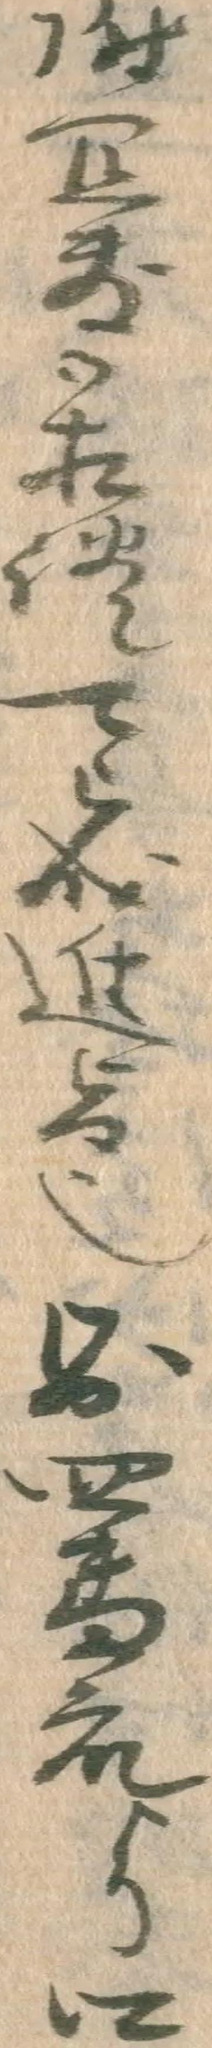附、宜敷御相談可被成進旨也、別四番衆より口
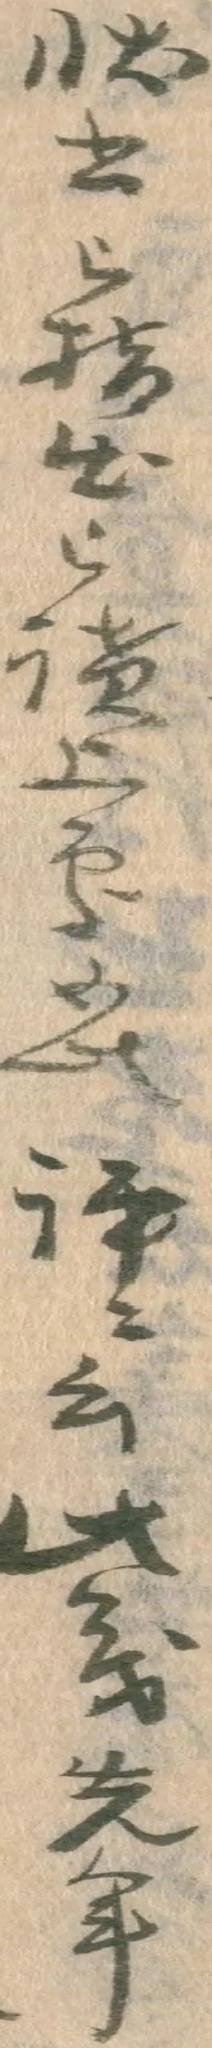状書被指出被読上處如此、評二云、此義先年
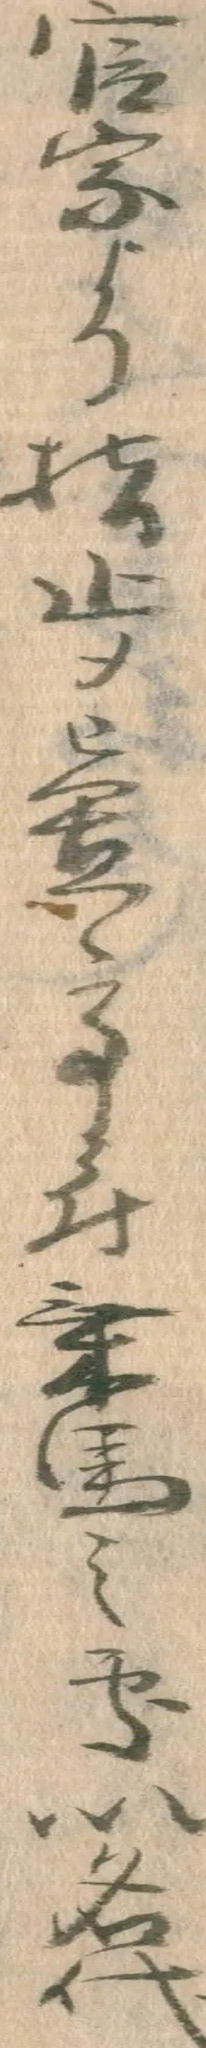官家より指止メ被置候事ニ付、乗馬之處、以名代
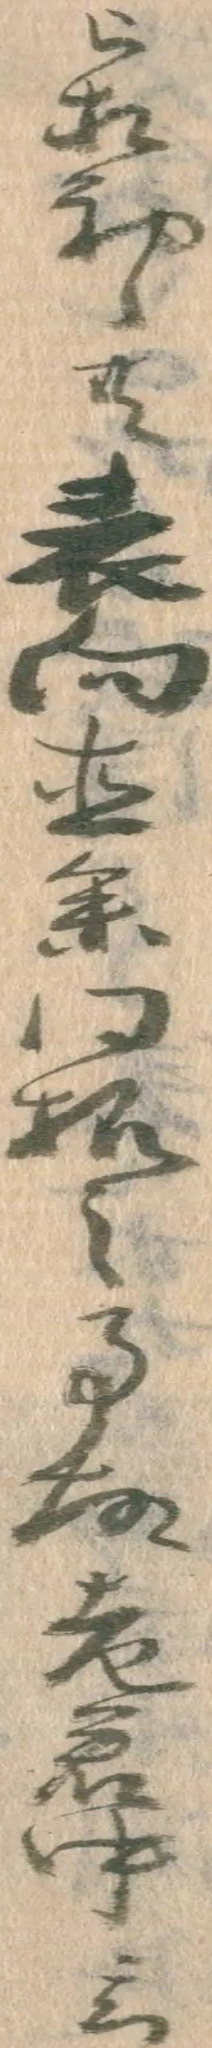被相勤候共、表向直参同様之事故、老若中に而
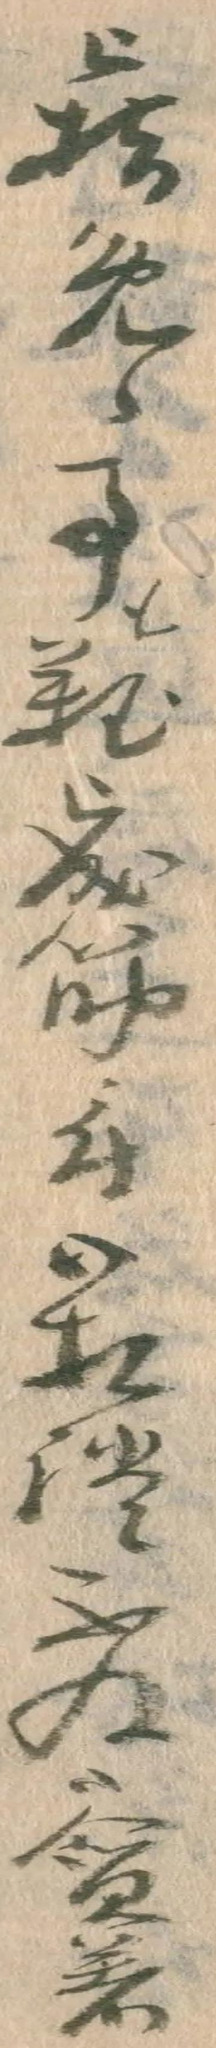被指免候事も難被成筋ニ付、御相談不為ハ、貪着
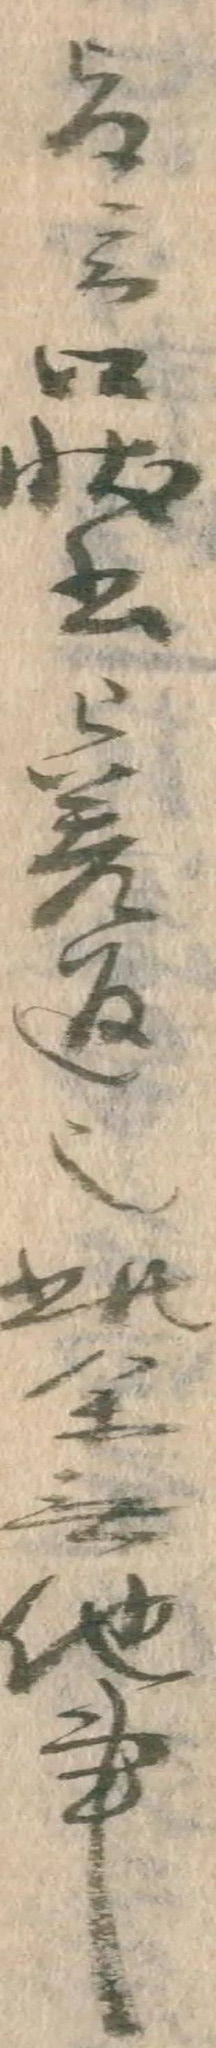旨ニ而口状書被差返也、此余無他事、
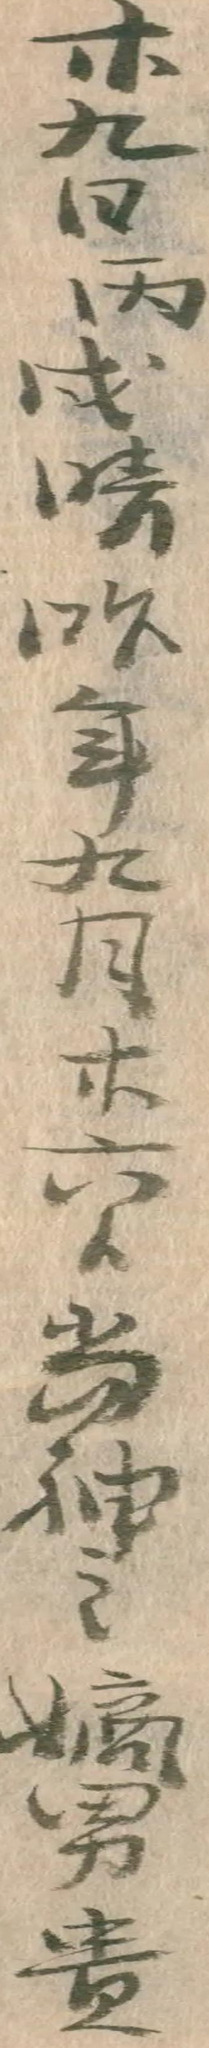廿九日丙戌晴、昨年九月廿六日當神主嫡男貴
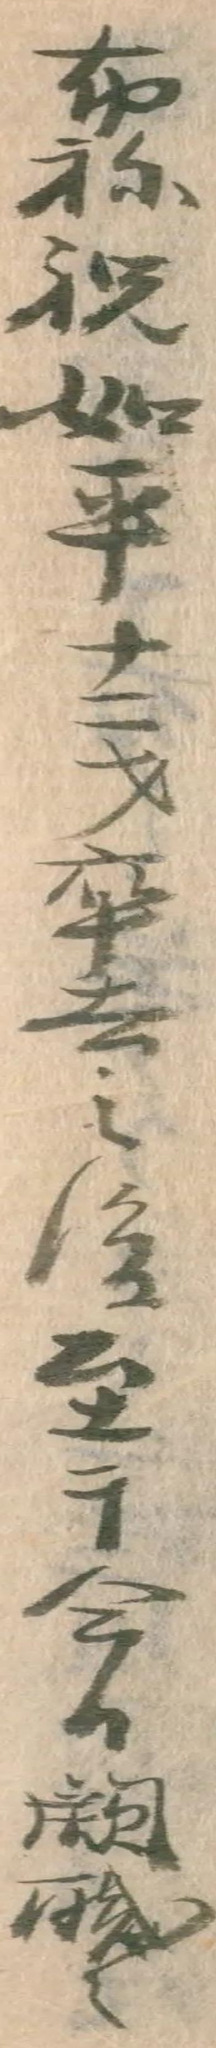布祢祝如平十二才卒去之後、至于今日闕職之
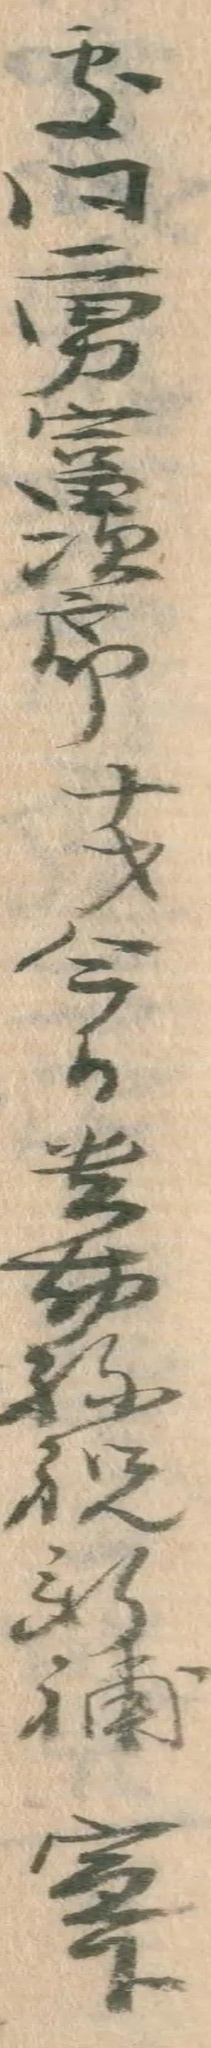處、同二男富次郎十才、今日貴布称祝新補宣下
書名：賀茂社記録. 第63冊
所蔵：国立国会図書館 National Diet Library, JAPAN
